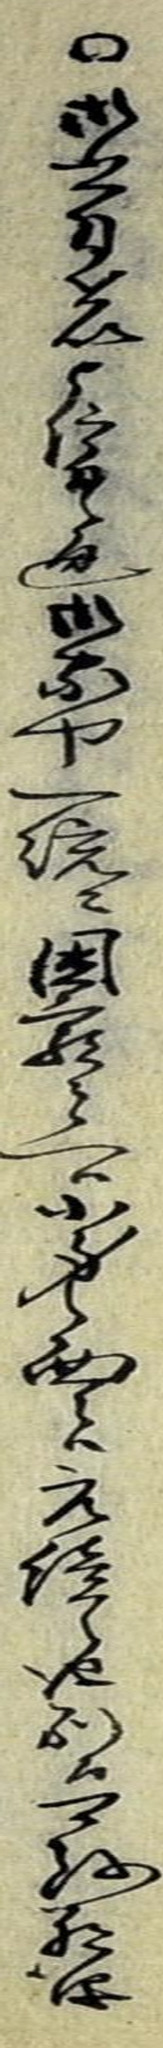〇御書付を以被仰付候通御家中一統に困窮に候へは小身之面々は取続之儀別而可致難儀
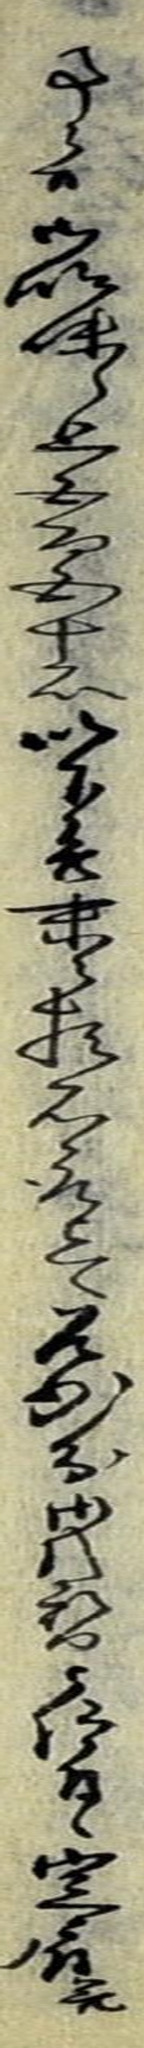事に候御吟味之上五百五十石以下并末々拾石取迄へ乍少分御引替被仰付候定府并
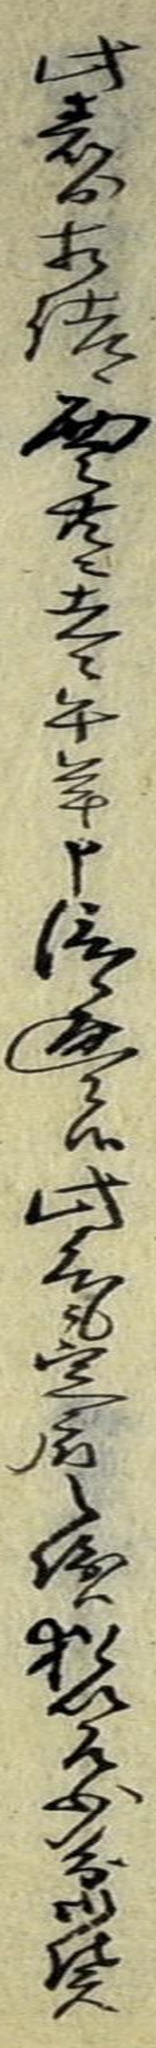此表ゟ相詰候面々共に去々午年申渡候通に候此度も定府之儀は猶以乍少分御貸
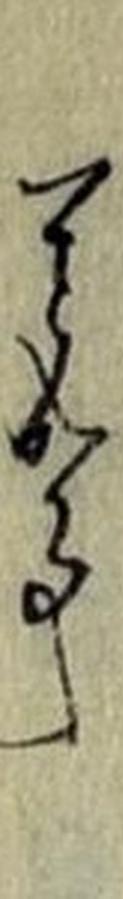可被成事
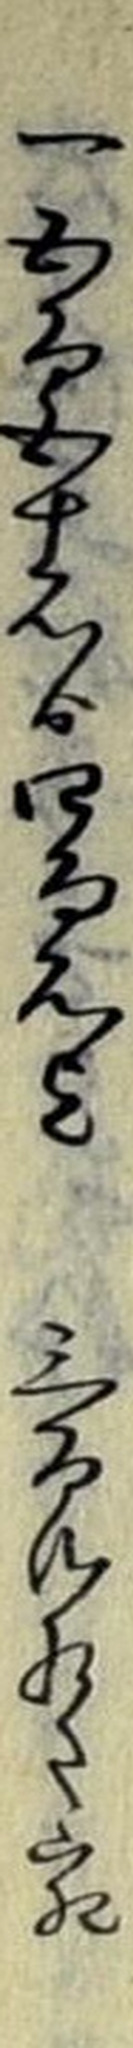一五百五十石ゟ四百石迄三百弐拾匁宛
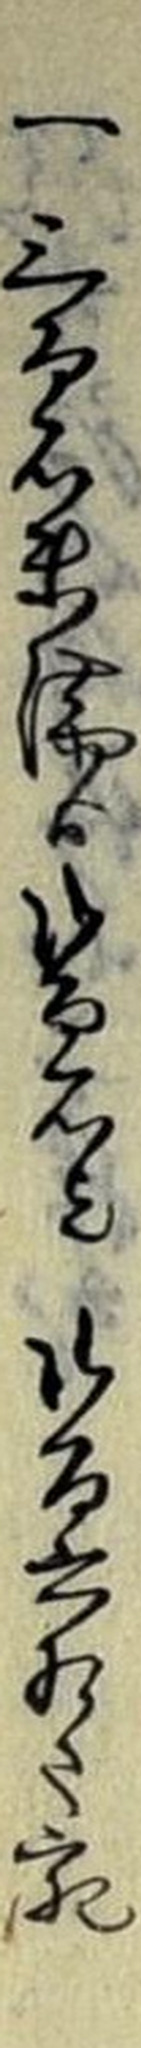一三百石未満ゟ弐百石迄弐百六拾匁宛
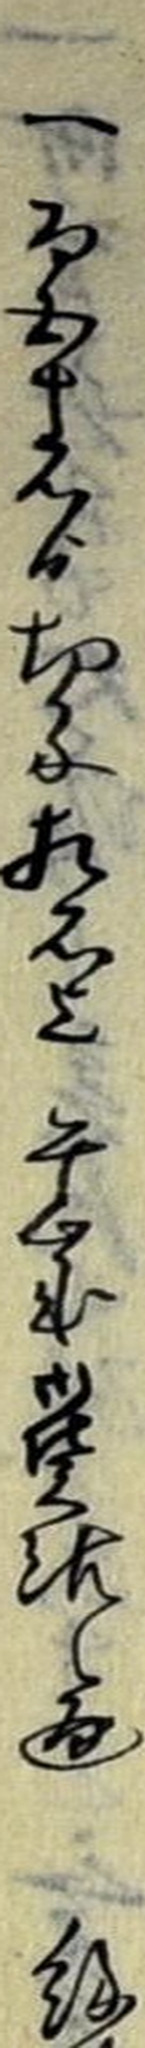一百五十石ゟ切米拾石迄午歳御貸銀之通余略之
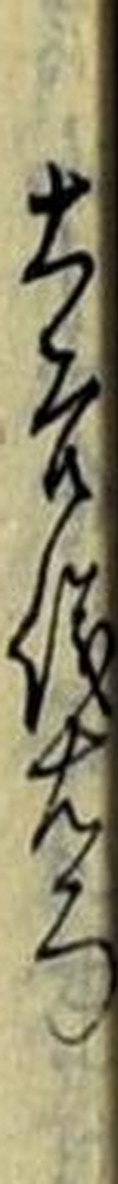大谷儀右衛門
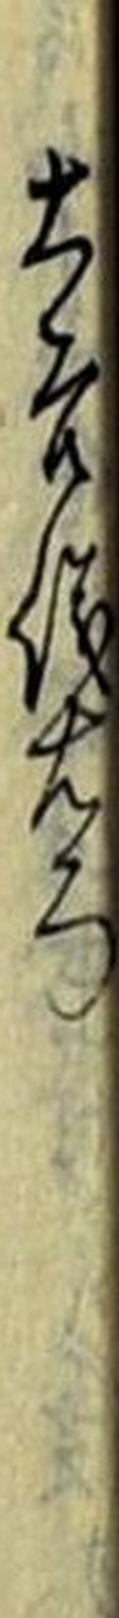大谷儀右衛門
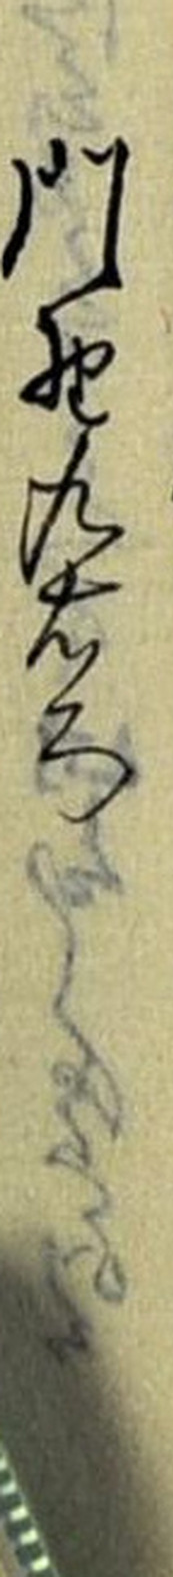門野九右衛門
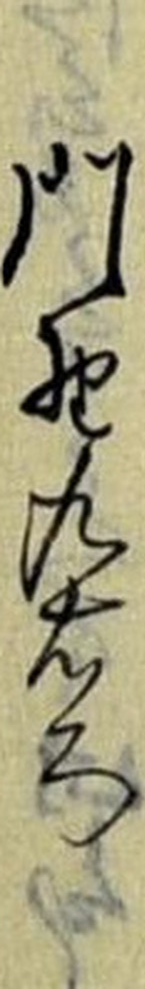門野九右衛門
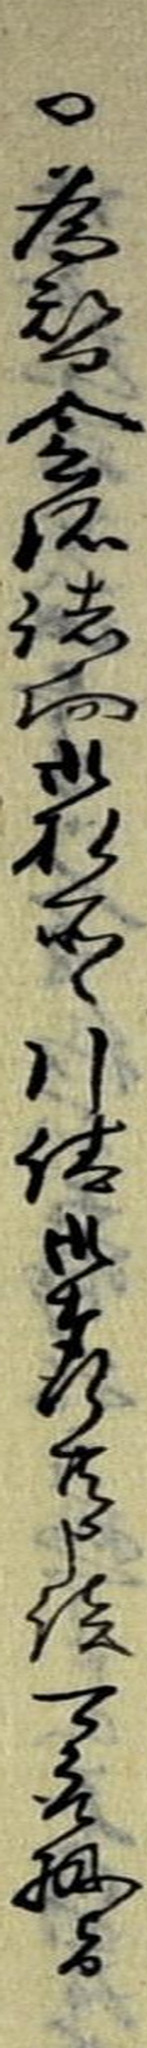〇為替会所諸向御札所へ引請御奉行共申談可取扱旨
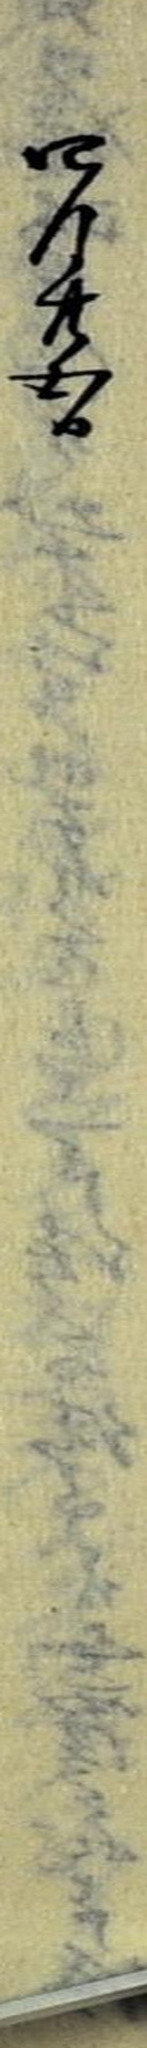四月廿五日
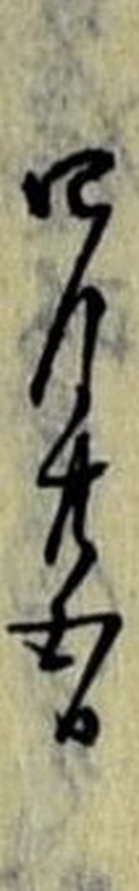四月廿五日
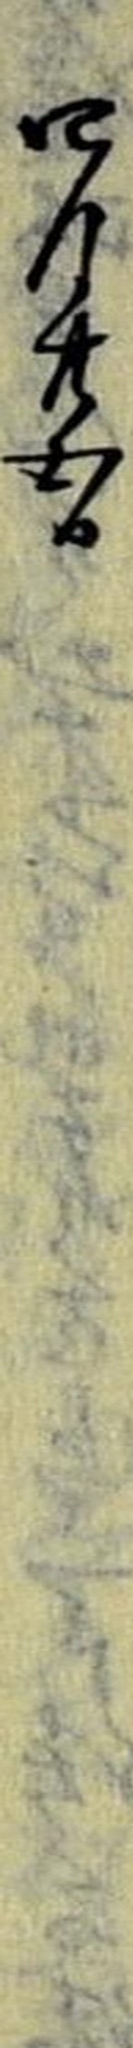四月廿五日
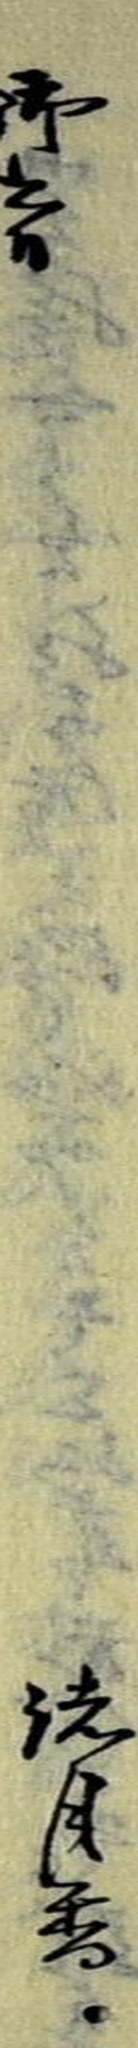御書付諸月番
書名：命令之部 二
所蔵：福井県文書館 Fukui Prefectural Archives
